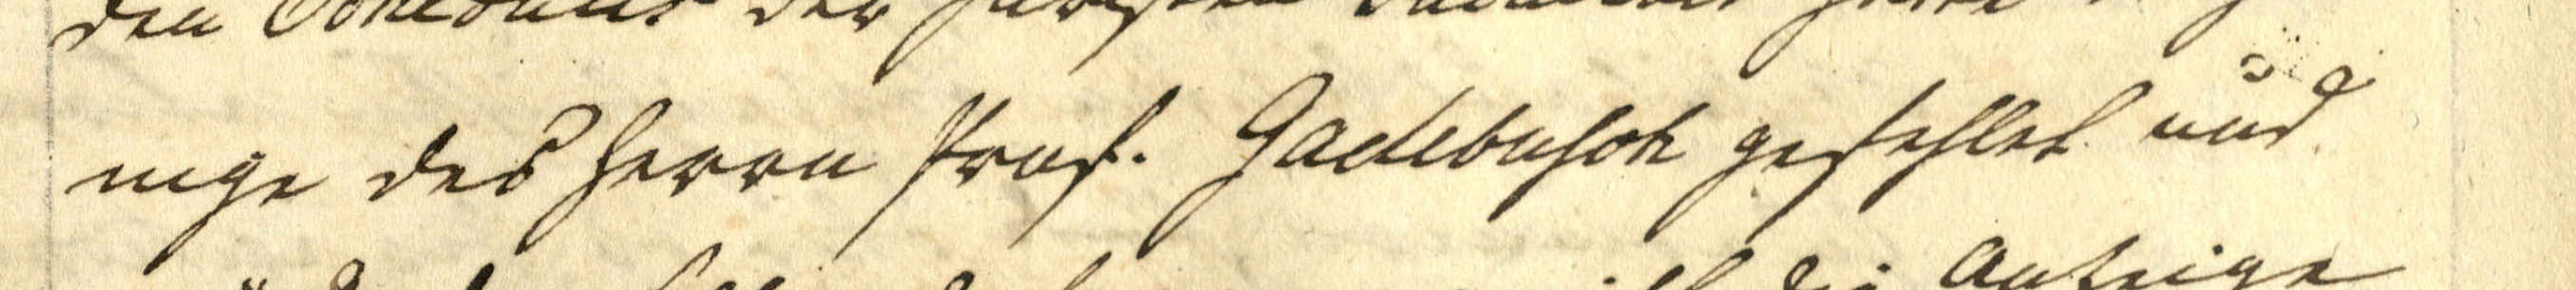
nige des Herrn Prof. Gadebusch gefehlet und
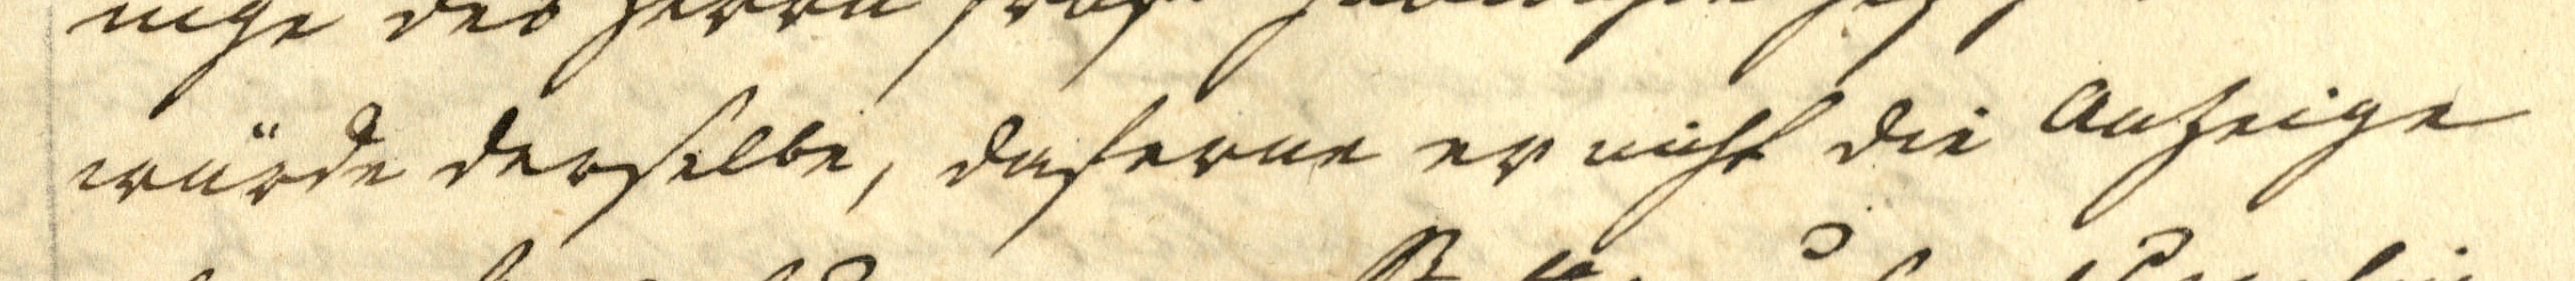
würde derselbe, daferne er nicht die Anzeige
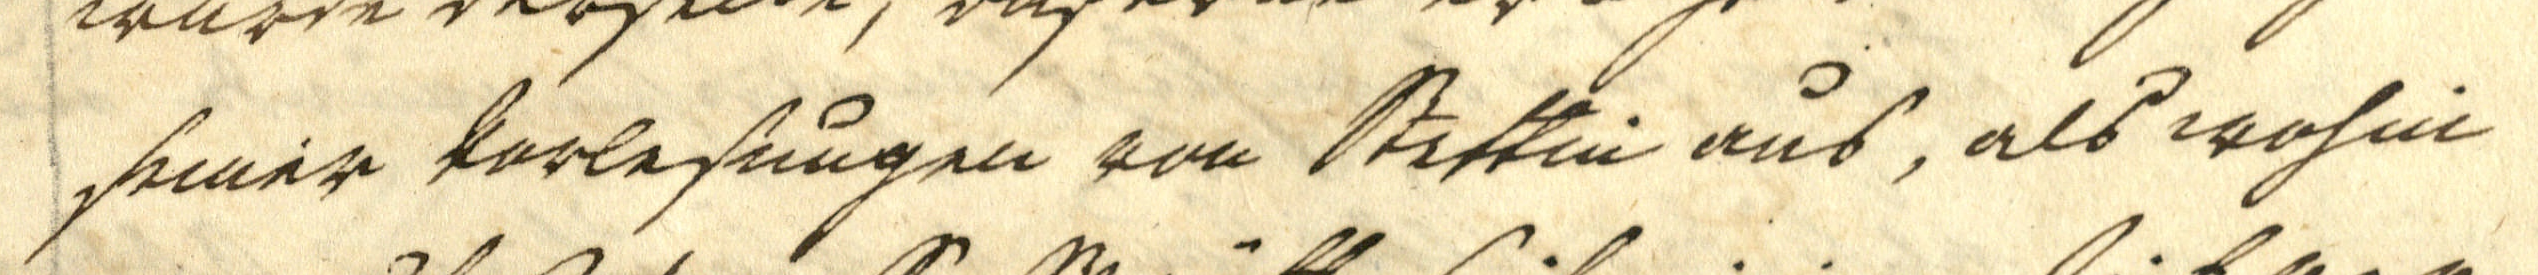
seiner Vorlesungen von Stettin aus, als wohin
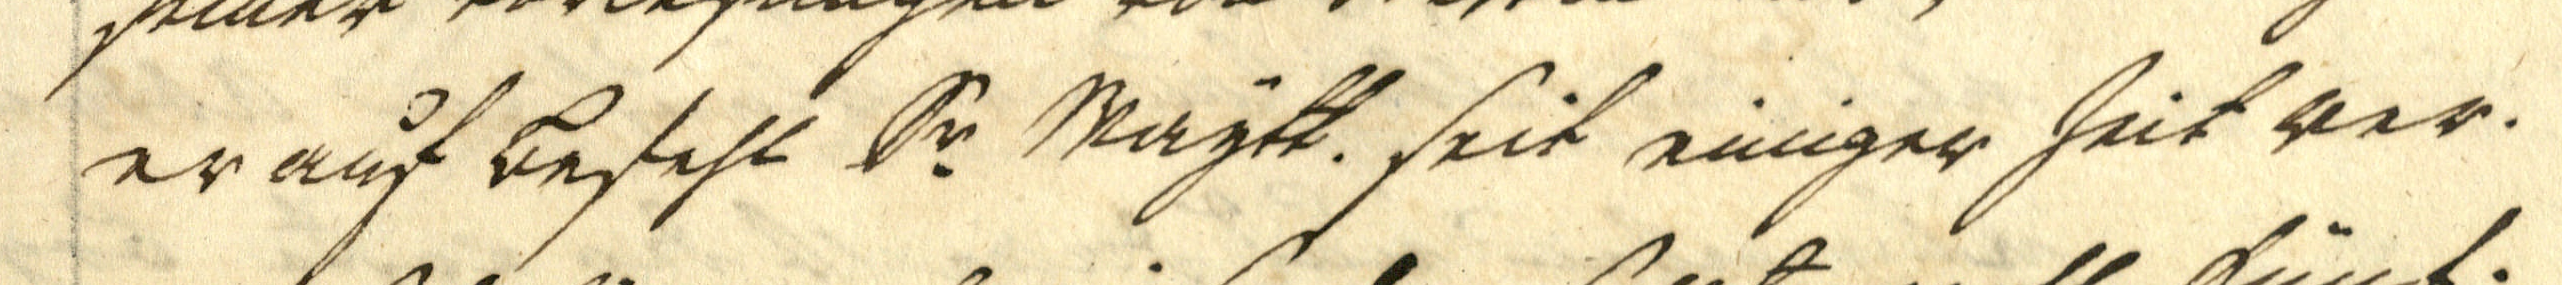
er auf Befehl Sr. Maÿtt. seit einiger Zeit ver¬
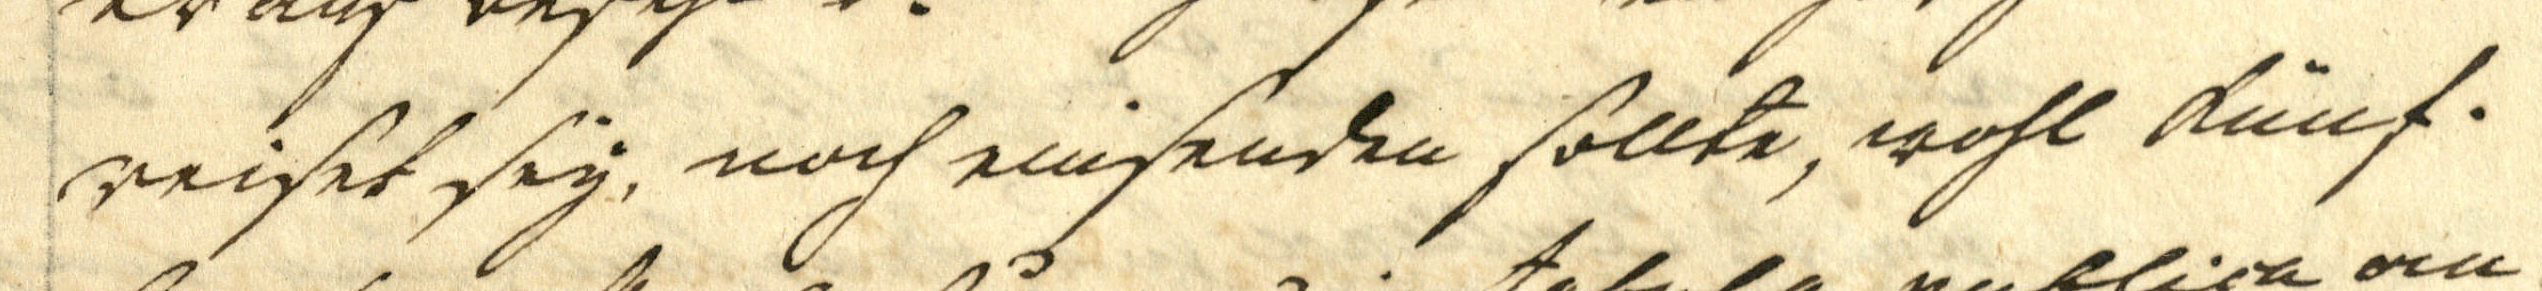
reiset seÿ, noch einsenden sollte, wohl künf¬
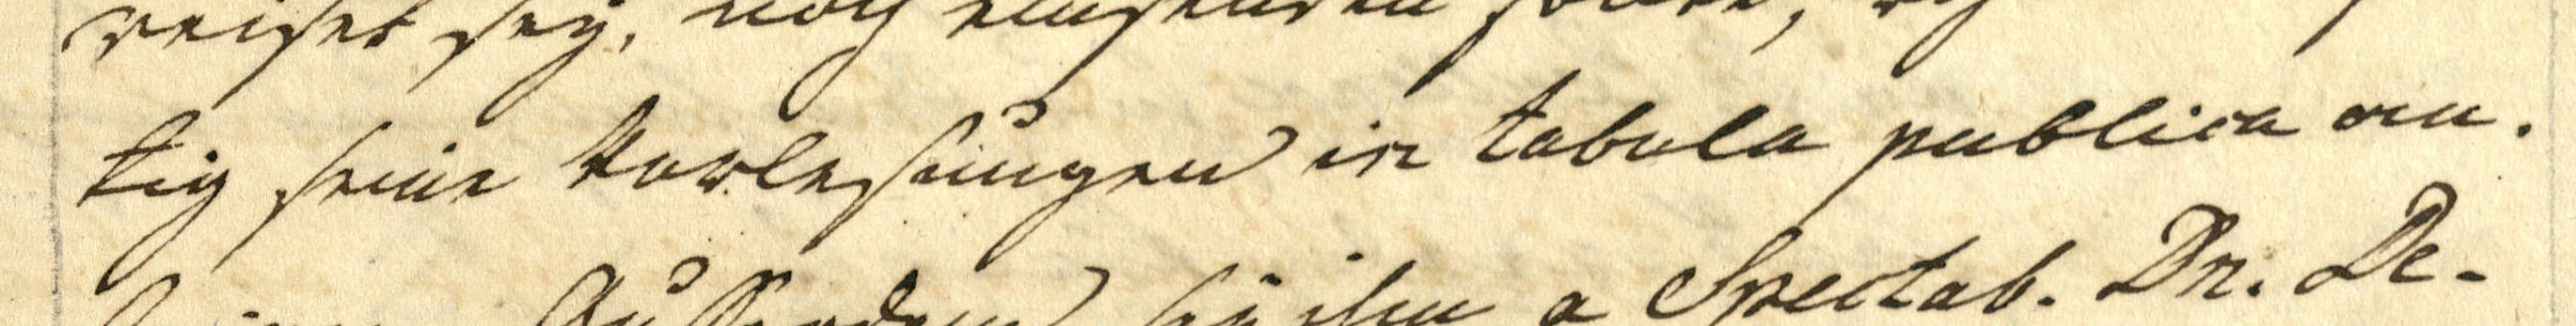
tig seine Vorlesungen in tabula publica an¬
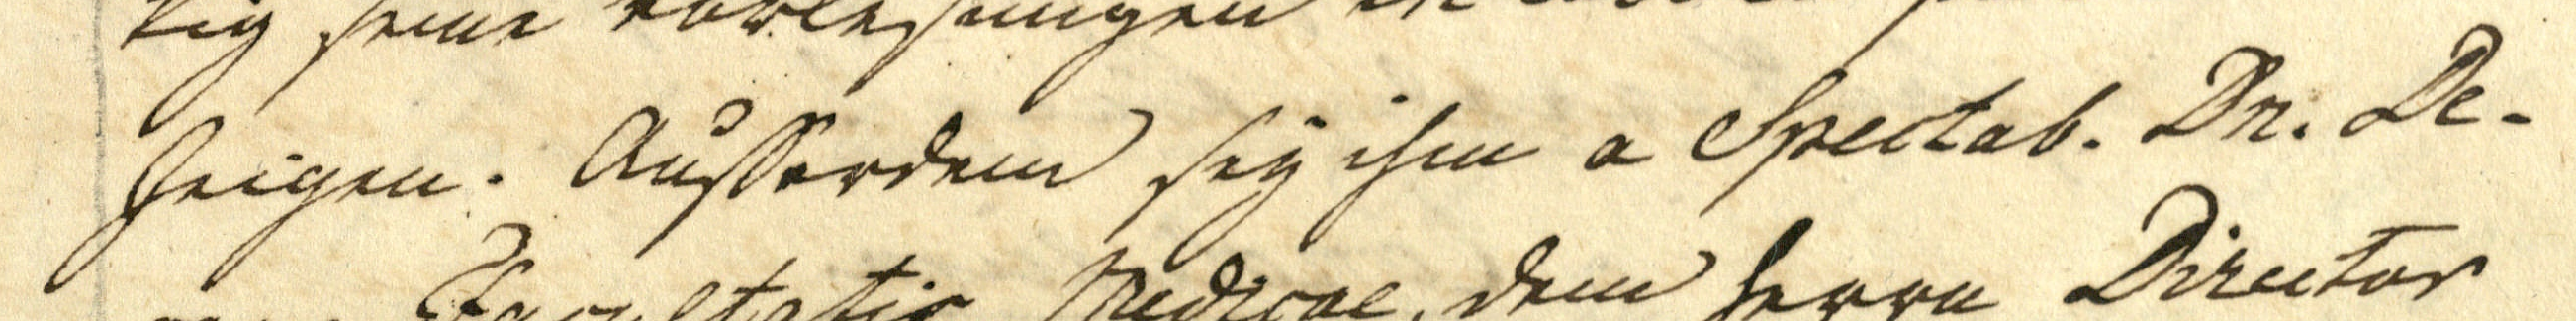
zeigen. Ausserdem sey ihm a Spectab. Dn. De¬
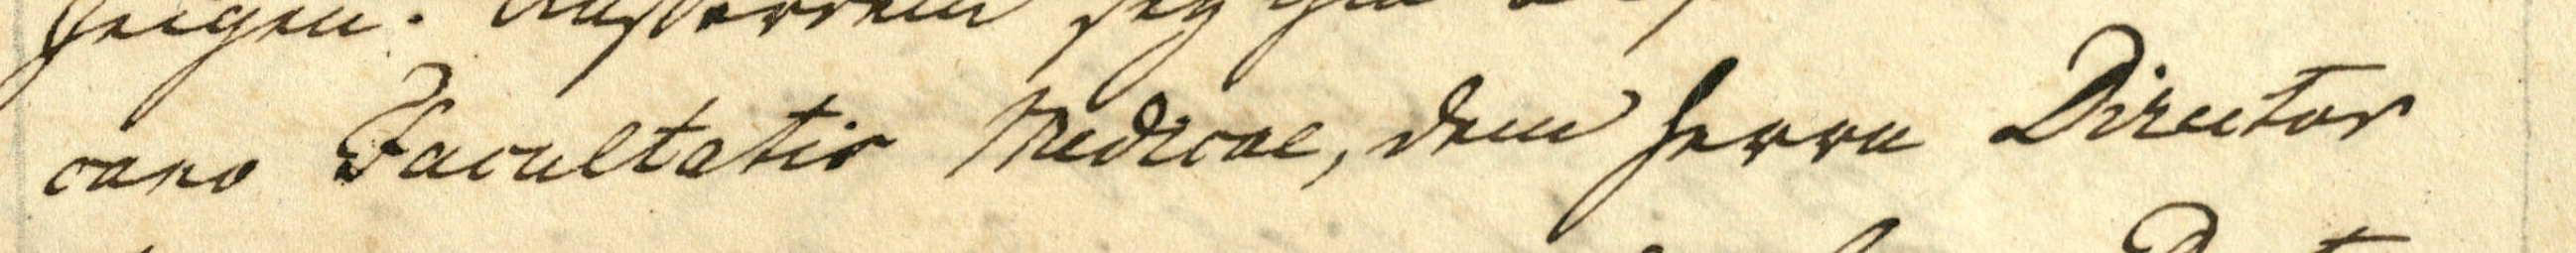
cano Facultatis Medicae, dem Herrn Director
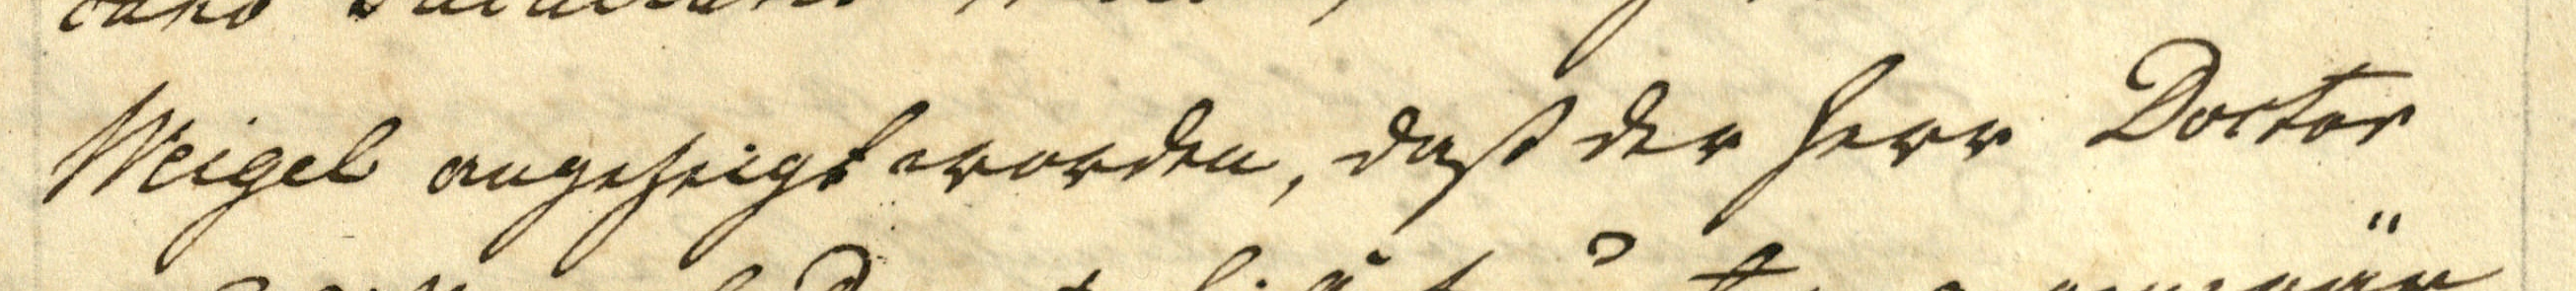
Weigel angezeigt worden, daß der Herr Doctor
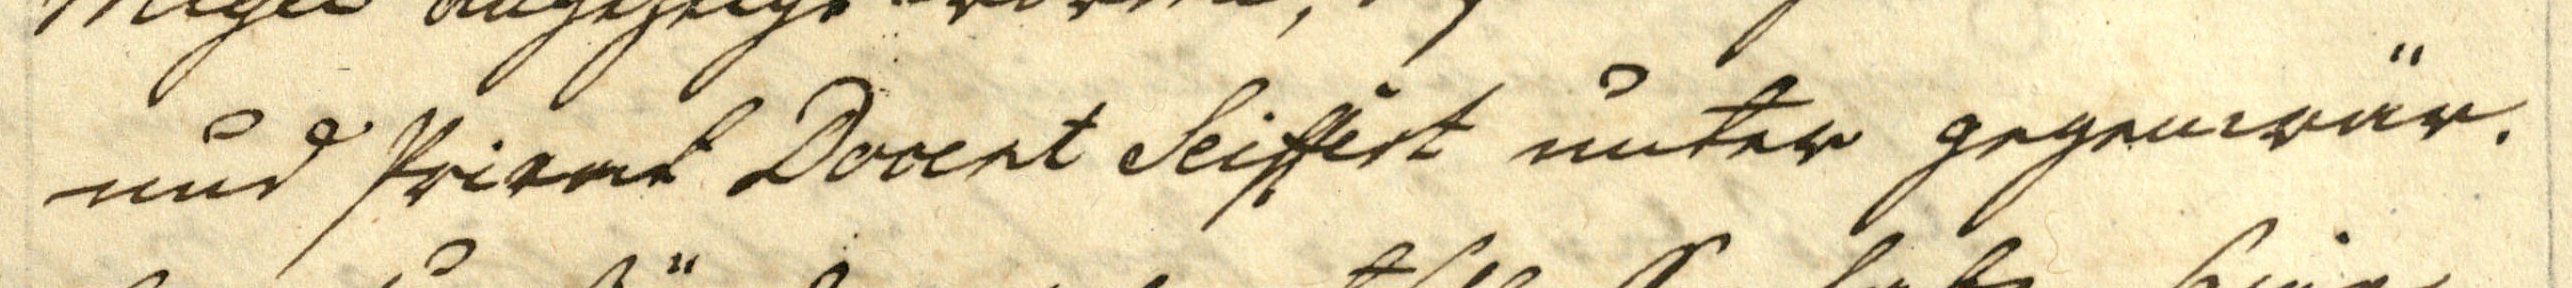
und Privat Docent Seiffert unter gegenwär¬
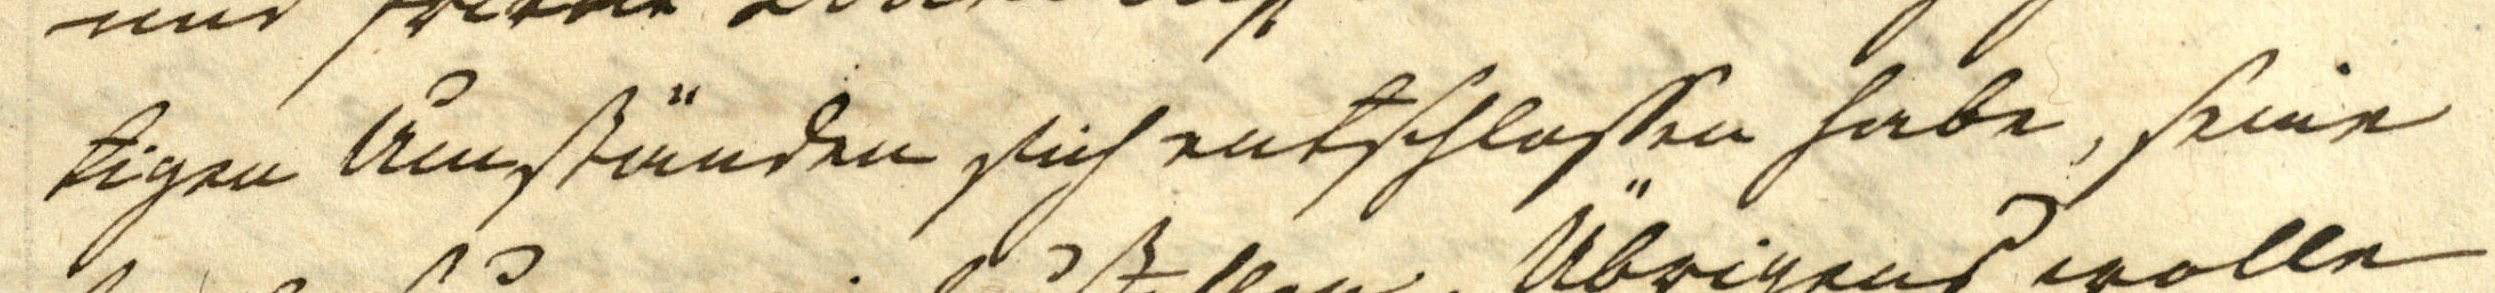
tigen Umständen sich entschlossen habe, seine
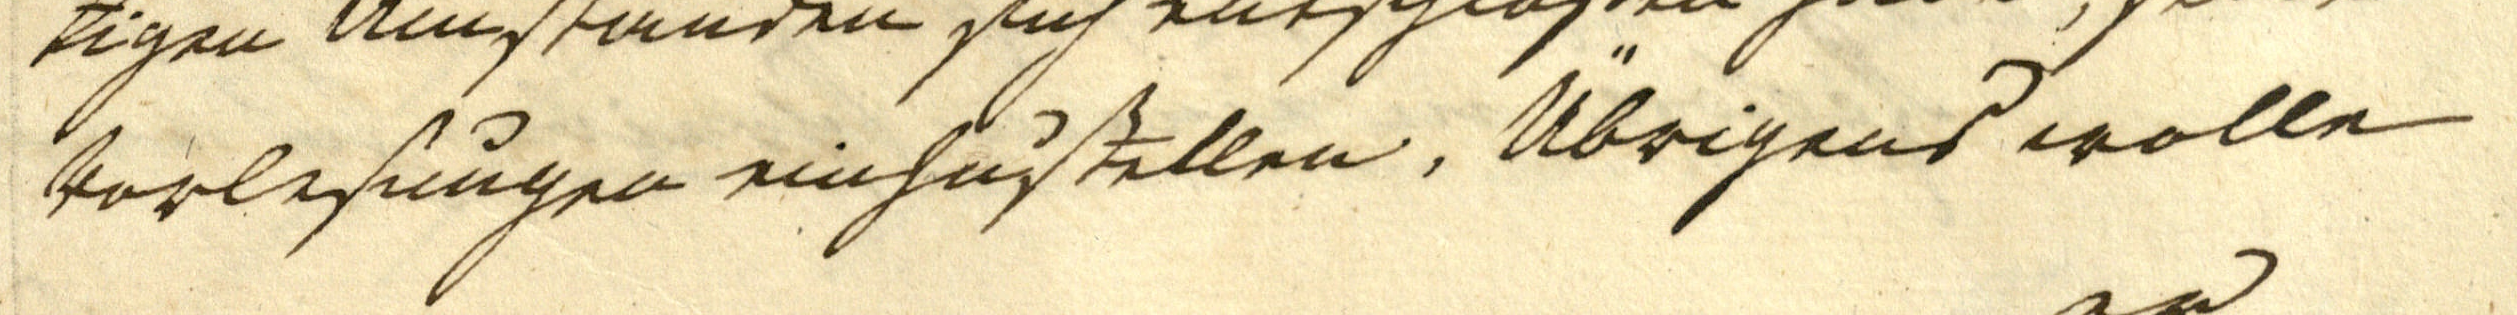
Vorlesungen einzustellen. Übrigens wolle
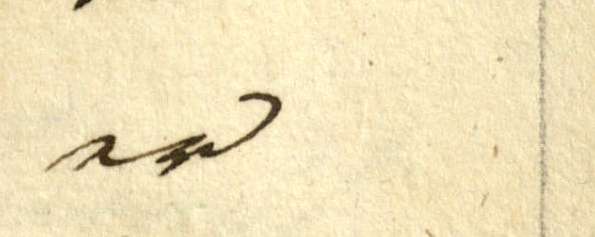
er
